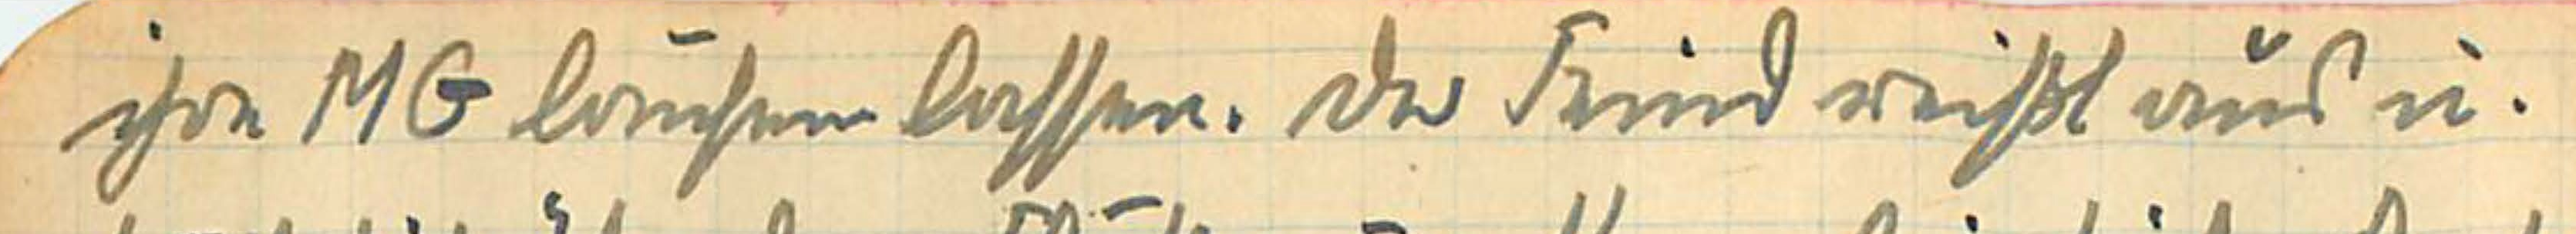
ihre MG laufen lassen. Der Feind reißt aus u.
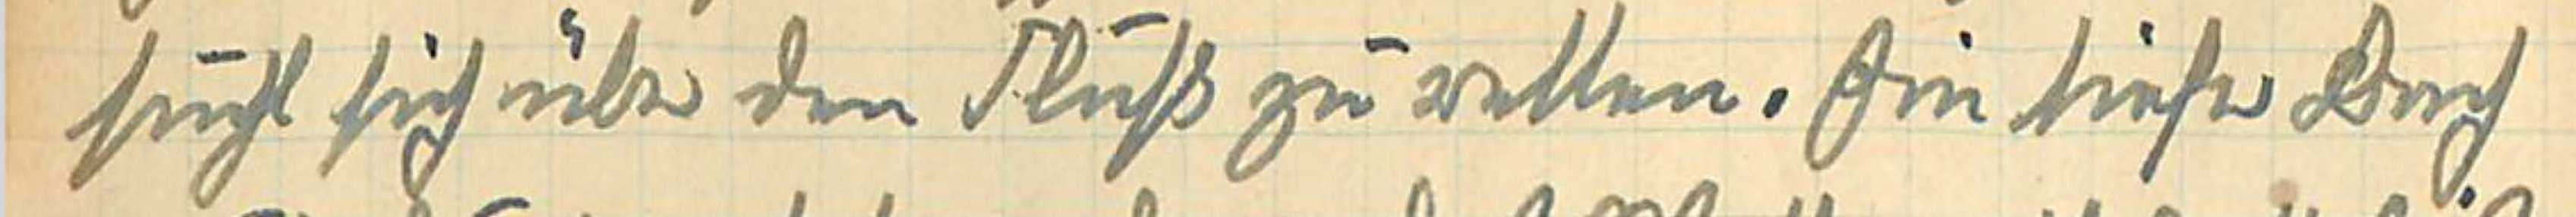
sucht sich über den Fluß zu retten. Ein tiefer Bach
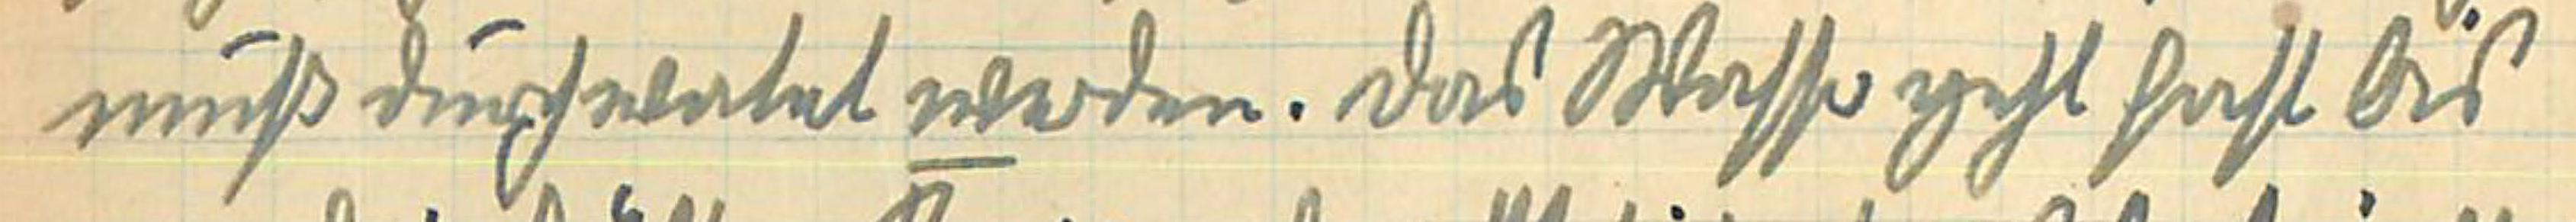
muß durchwatet werden. Das Wasser geht fast bis
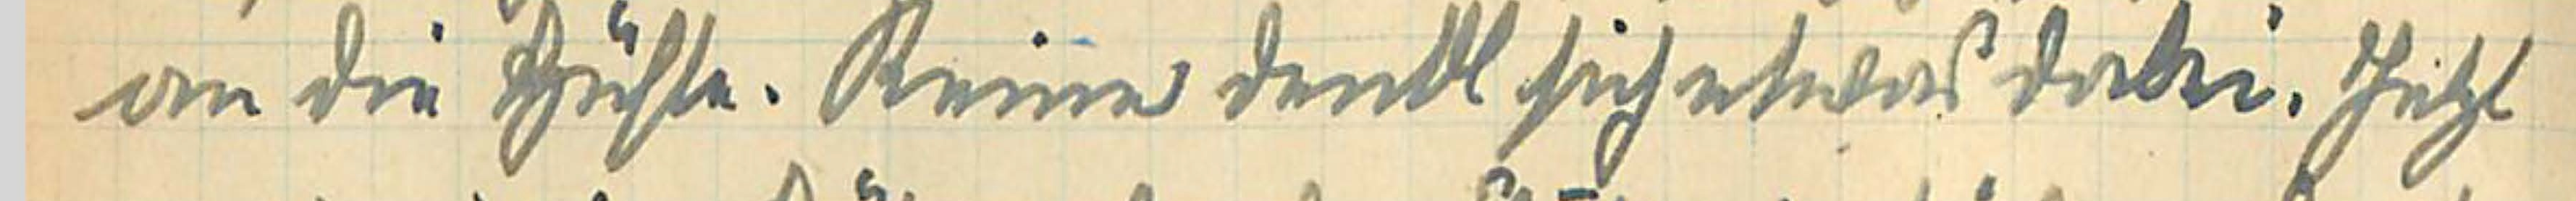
an die Hüfte. Keiner denkt sich etwas dabei. Jetzt
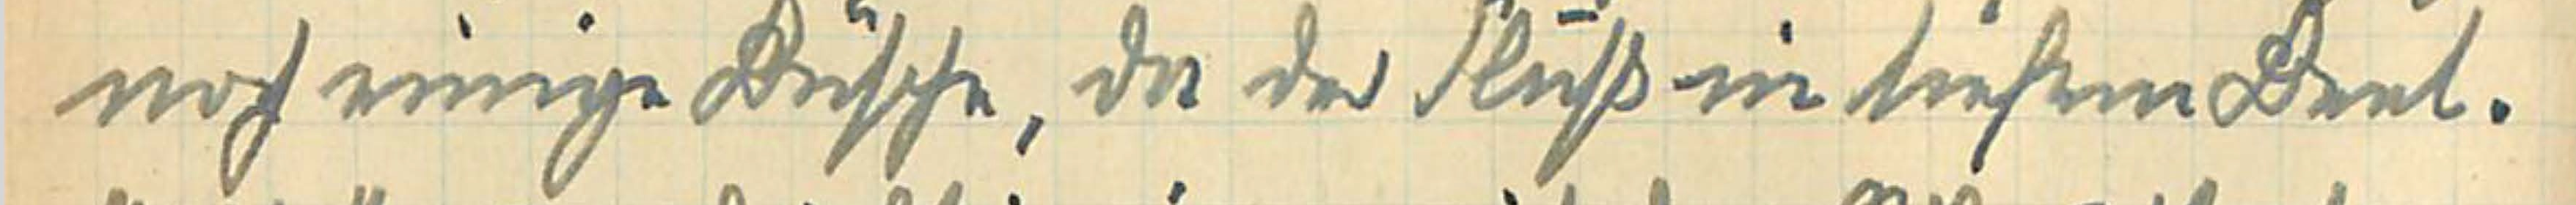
noch einige Büsche, da der Fluß in tiefem Beet.
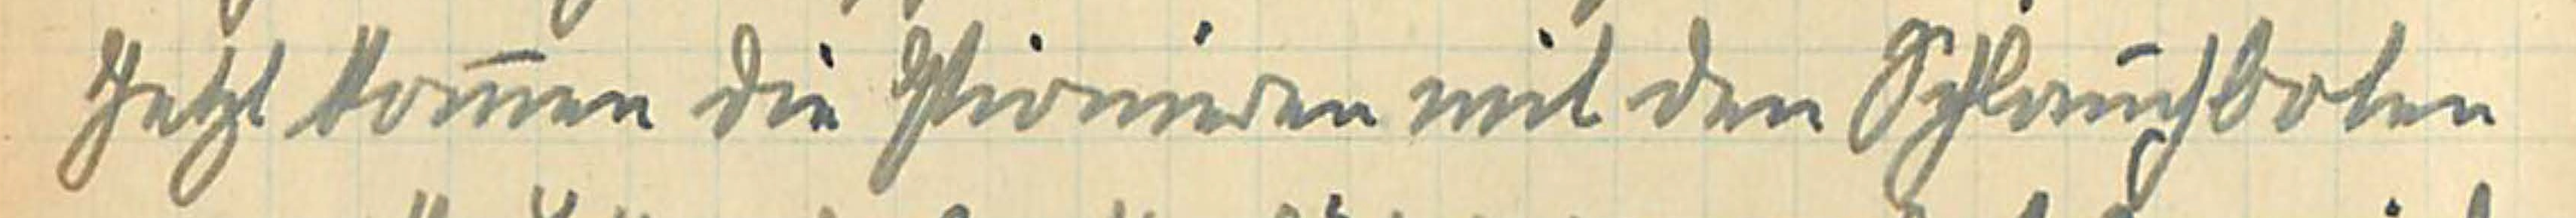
Jetzt kommen die Pionieren mit den Schlauchboten
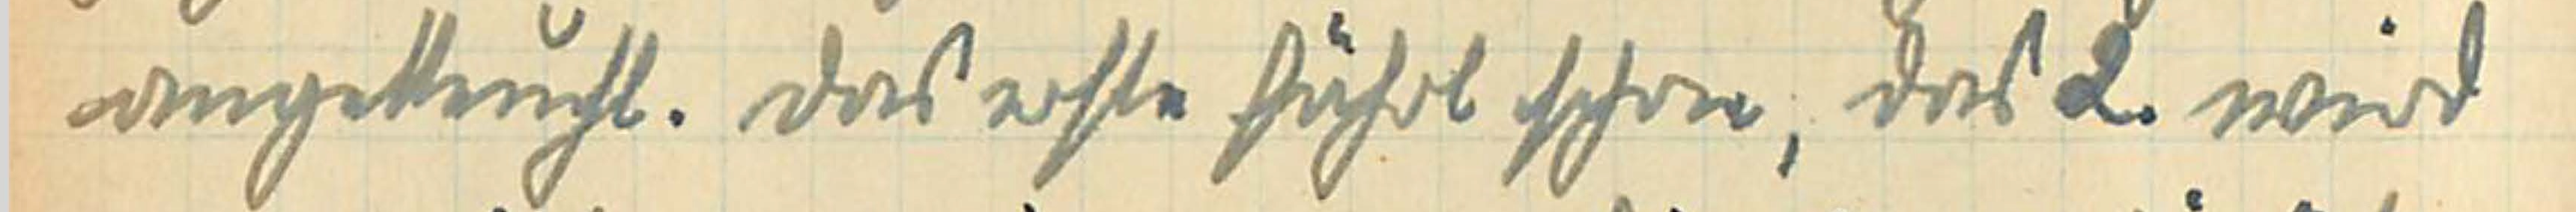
angekeucht. Das erste fährt schon, das 2. wird
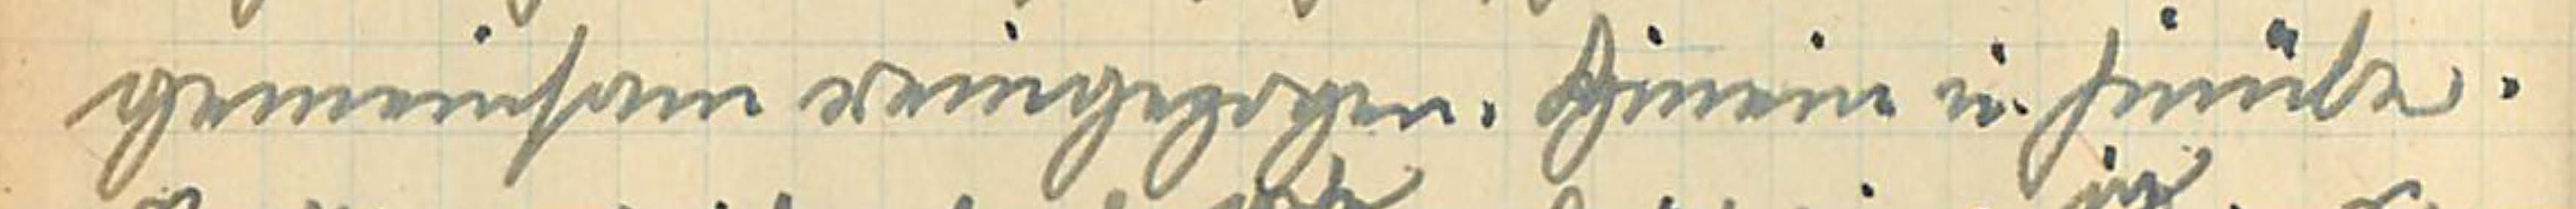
gemeinsam reingezogen. Hinein u. hinüber.
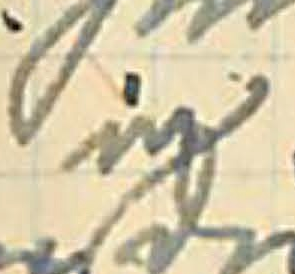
in
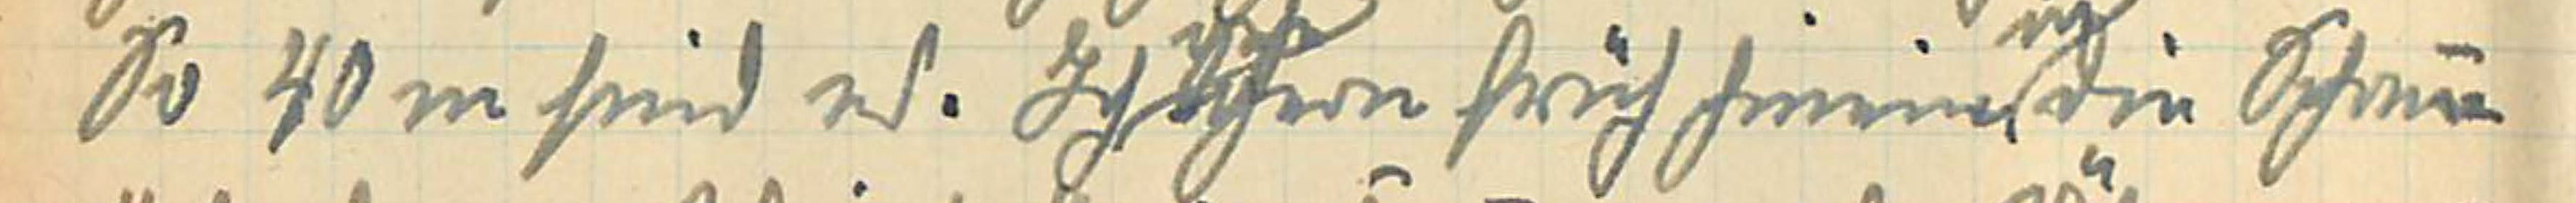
So 40 m sind es. Ich gehe gern früh hinein die Schau-
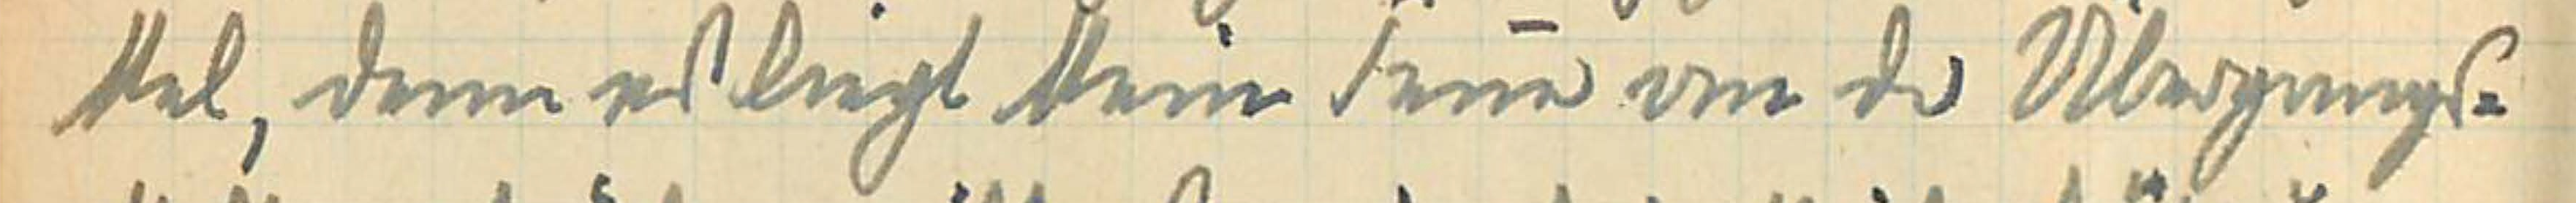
kel, denn es liegt kein Feuer an der Übergangs-
